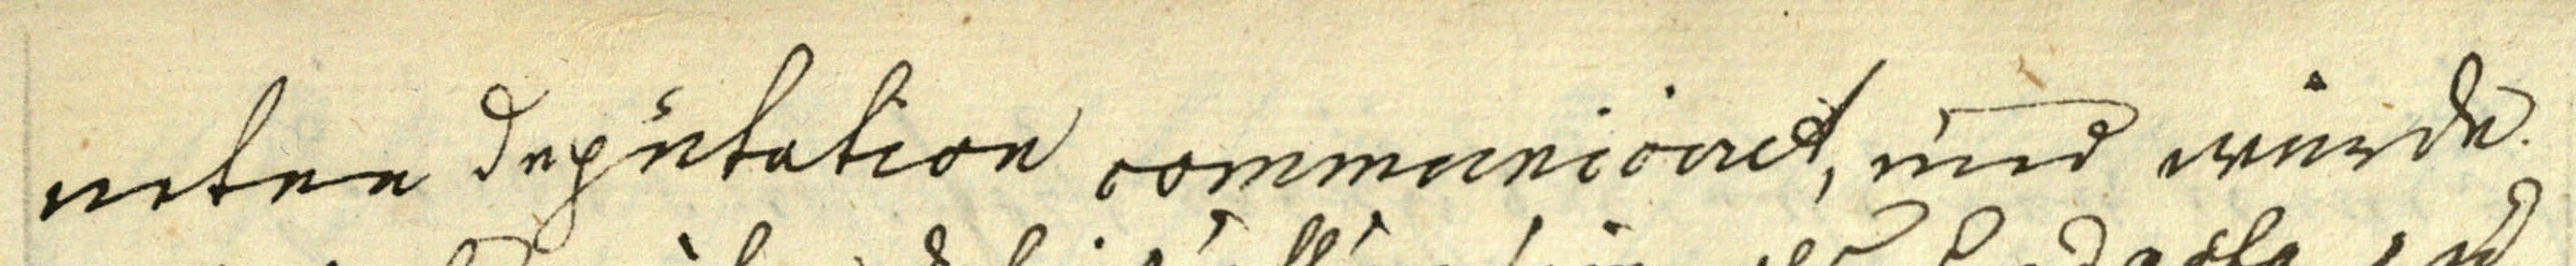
neten deputationcommuniciret, und würde
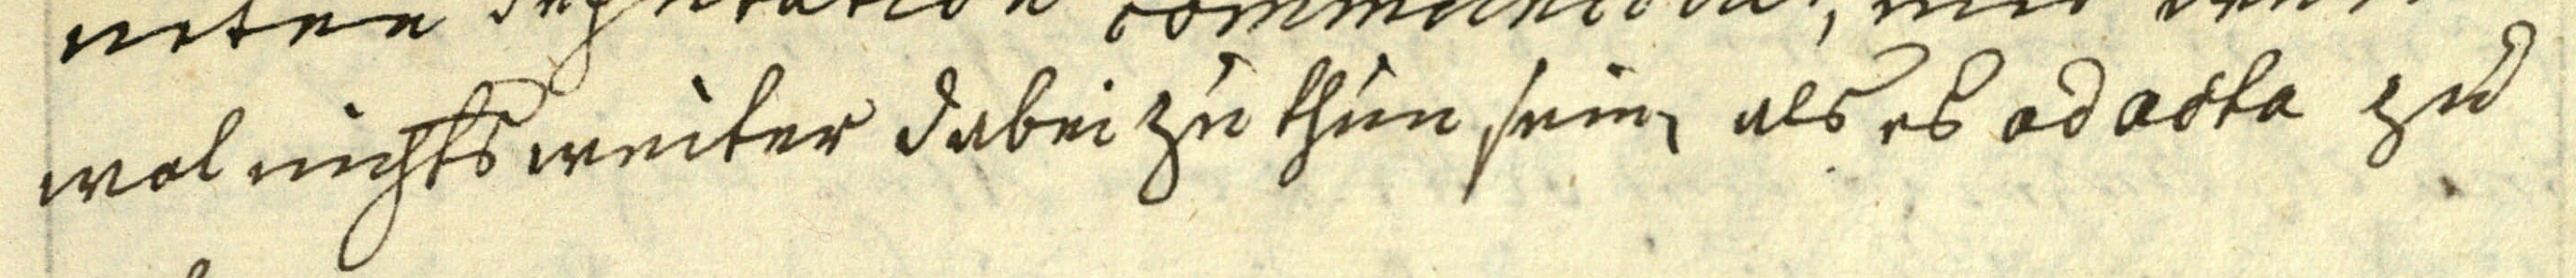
wol nichts weiter dabei zu thun sein, als es ad acta zu
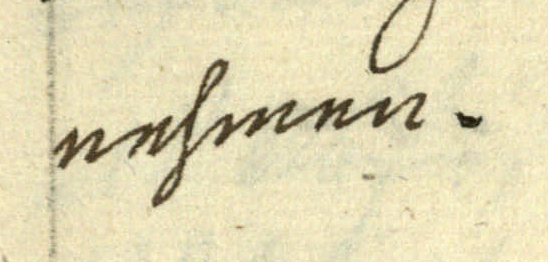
nehmen.
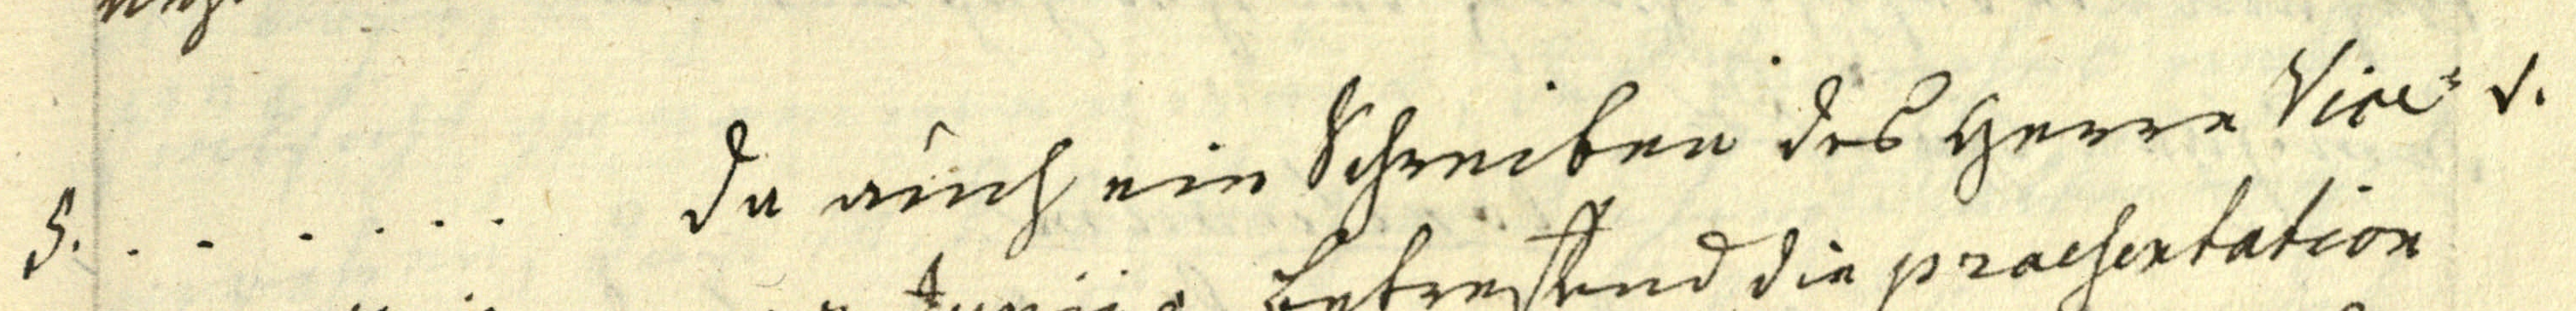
5. Da auch ein Schreiben des Herrn Vice¬
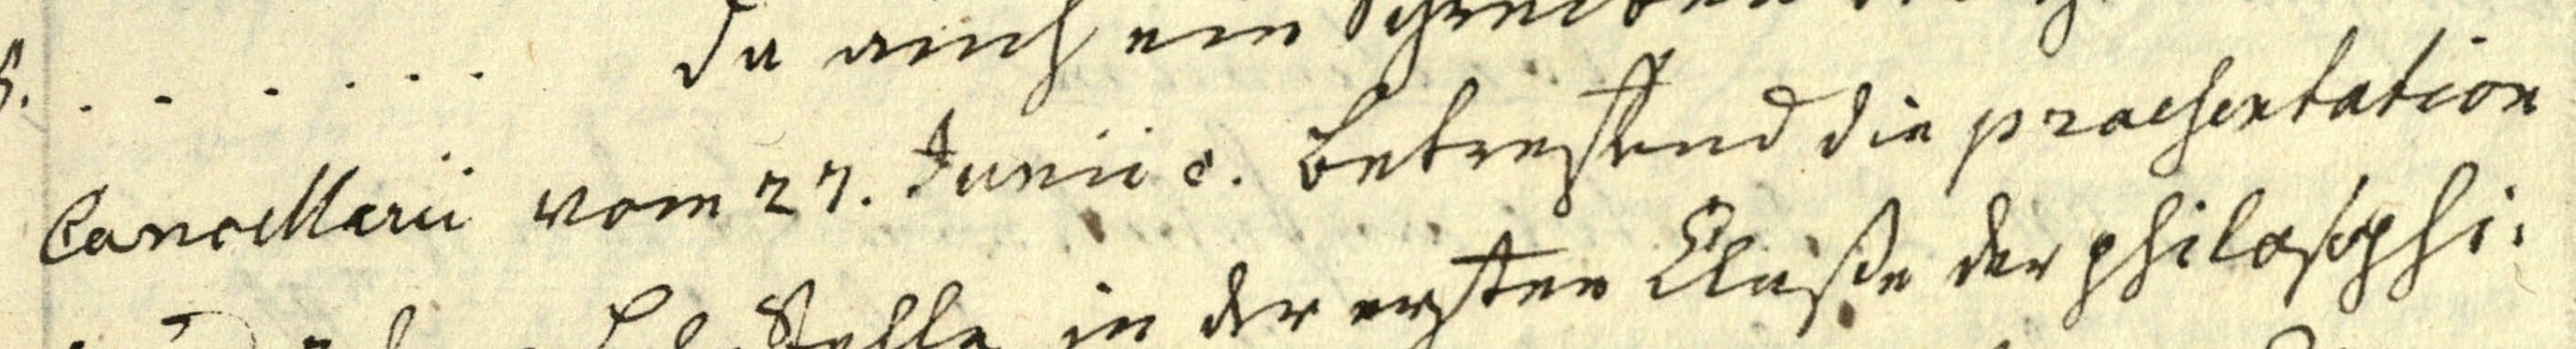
Cancellarii vom 27. Junii c. betreffend die praesentation
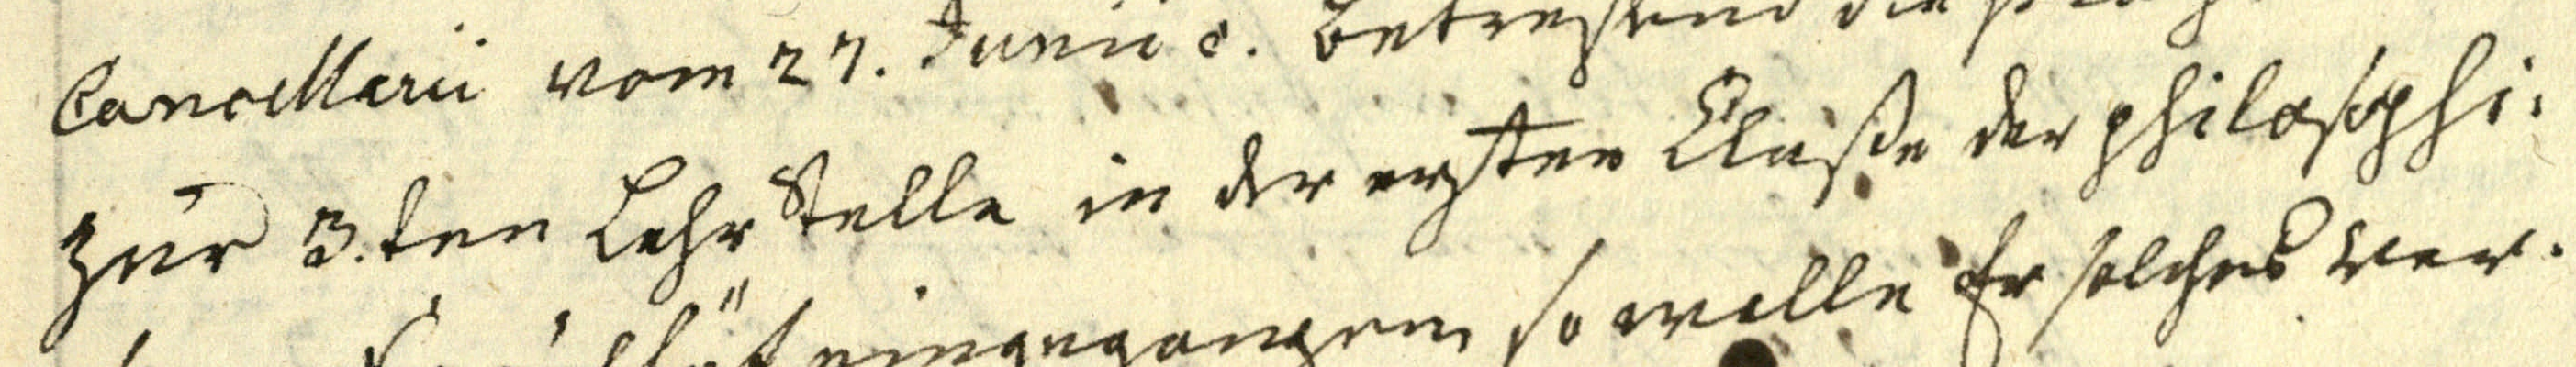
zur 3ten Lehrstelle in der ersten Classe der philosophi¬
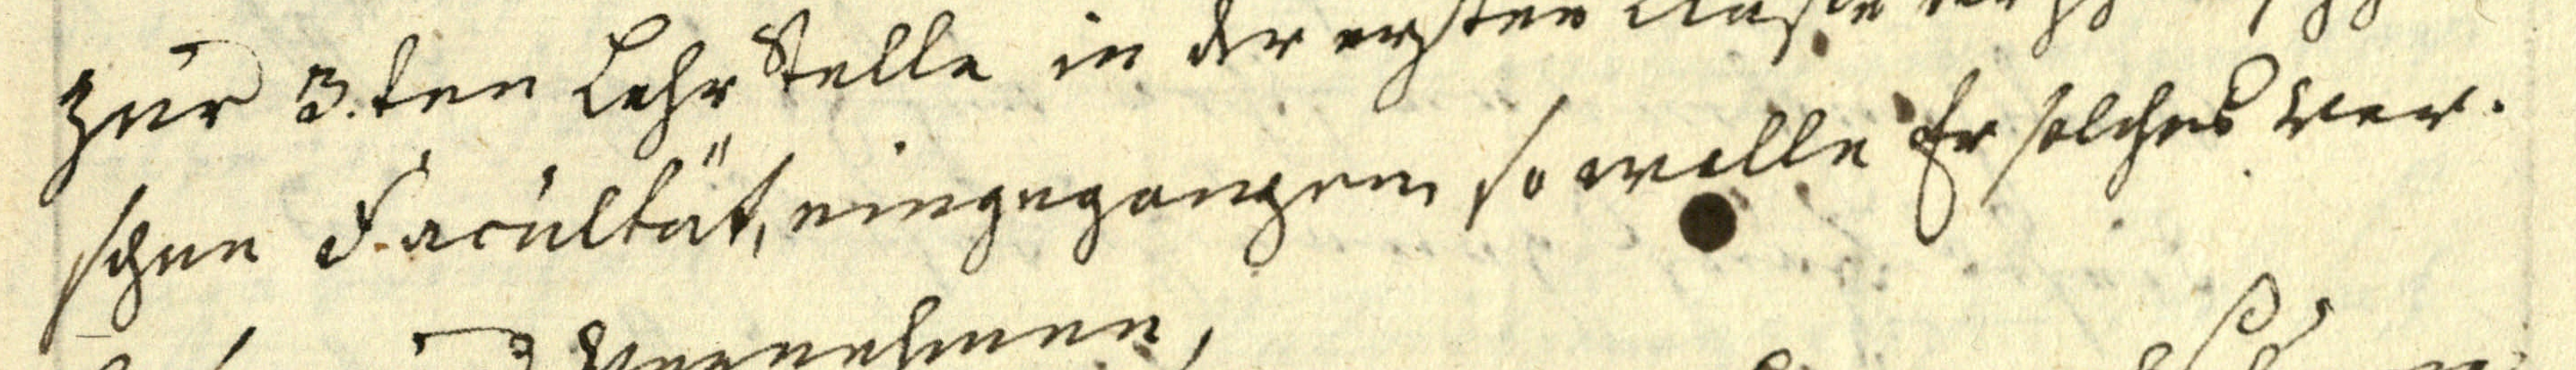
schen Facultät, eingegangen, so wolle Er solches ver¬
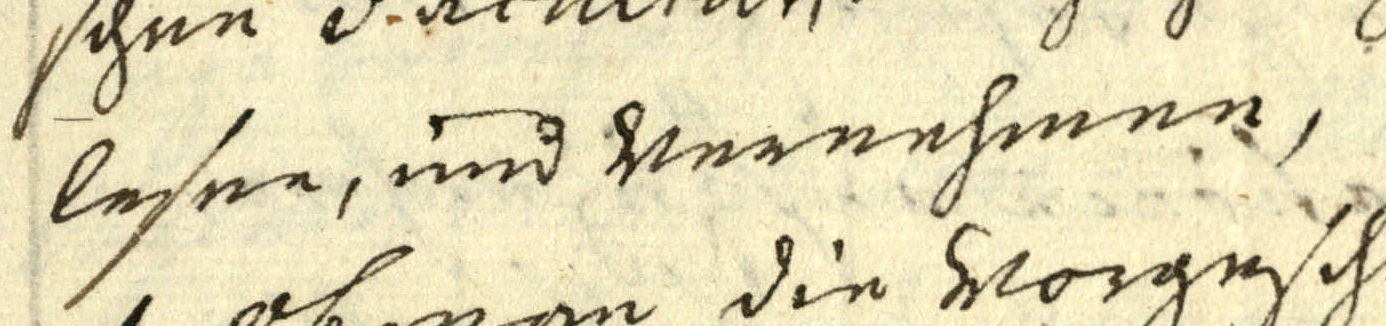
lesen, und vernehmen,
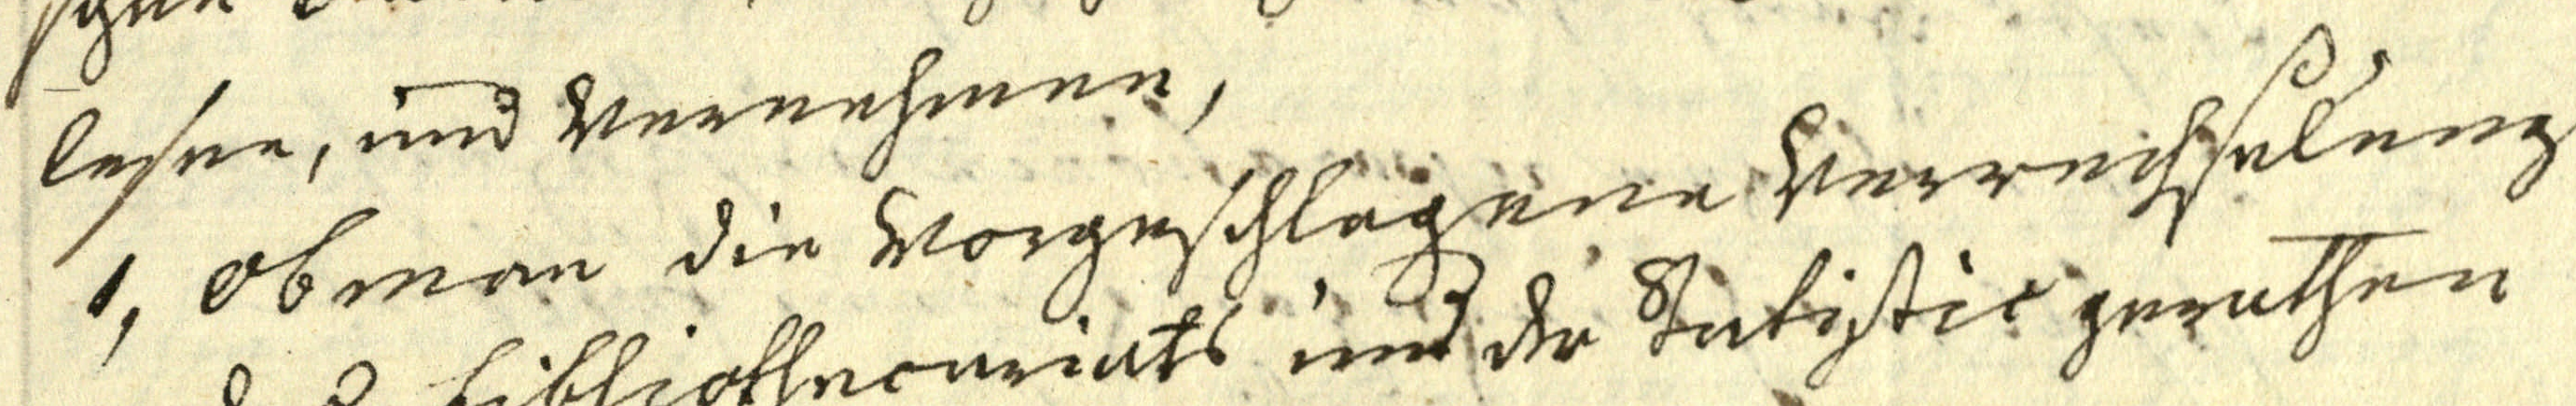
1, ob man die vorgeschlagene Verwechselung
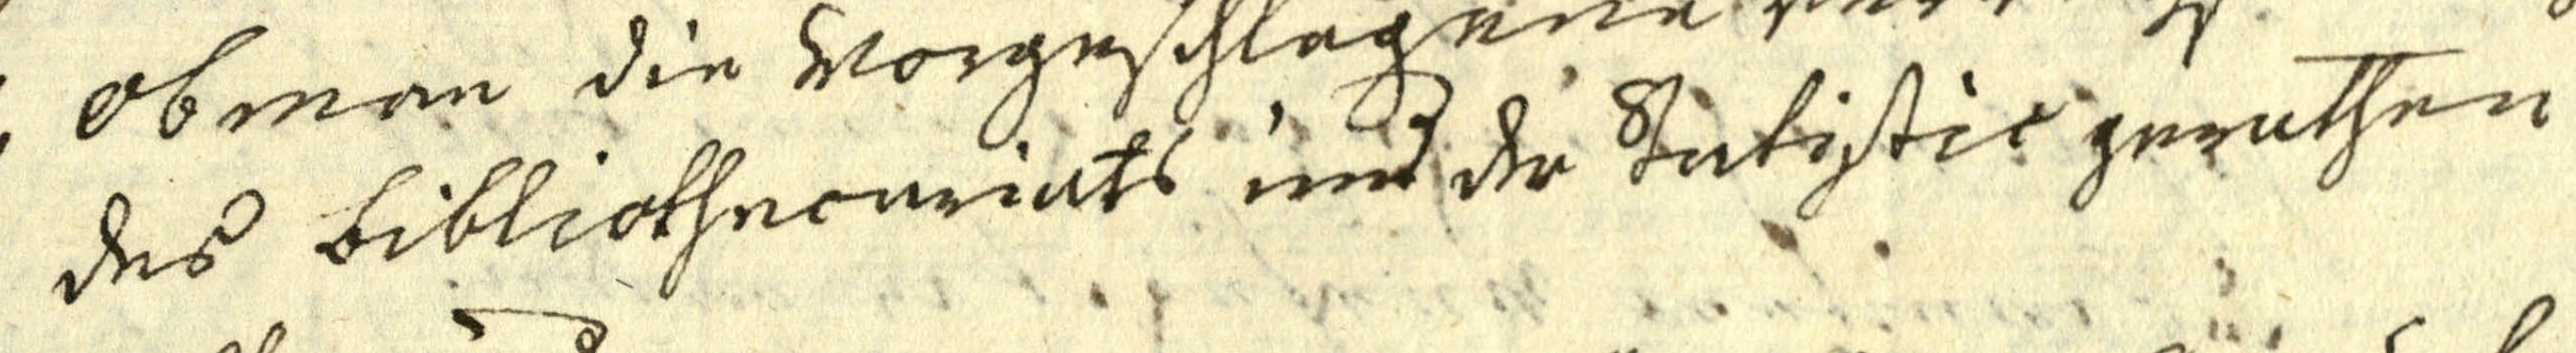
des Bibliothecariats und die Statistic gerathen
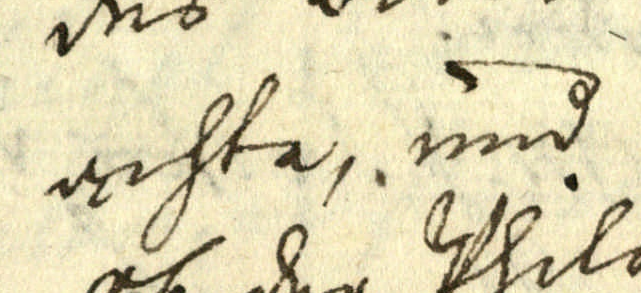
achte, und
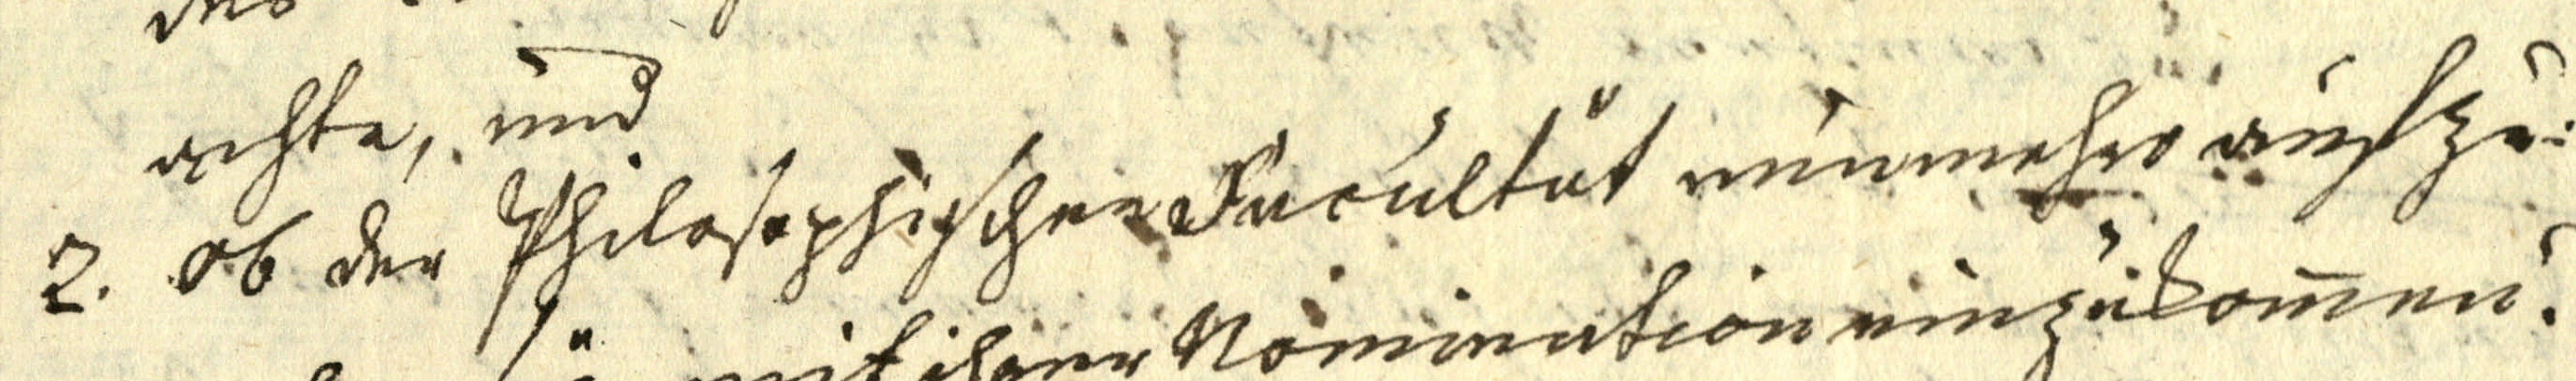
2. ob der Philosophischen Facultät nunmehro aufzu¬
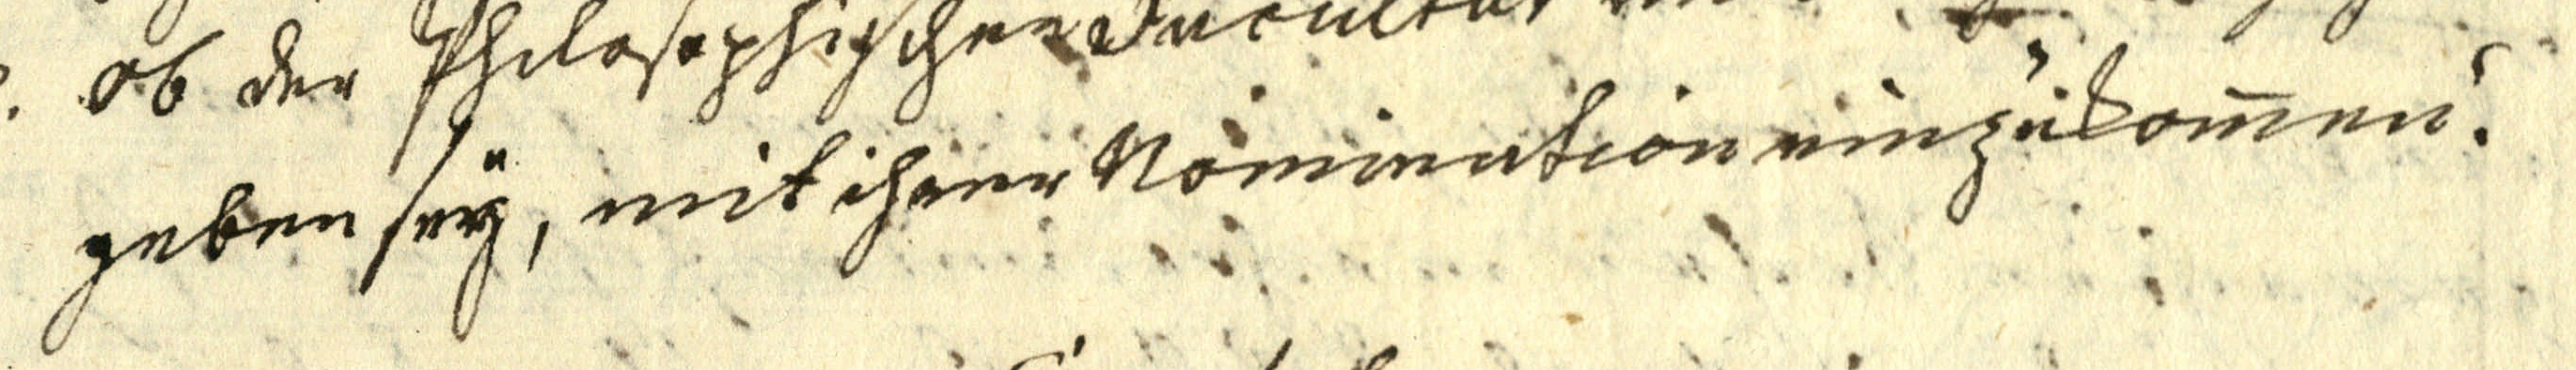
geben seÿ, mit ihrer Nomination einzukomen?
